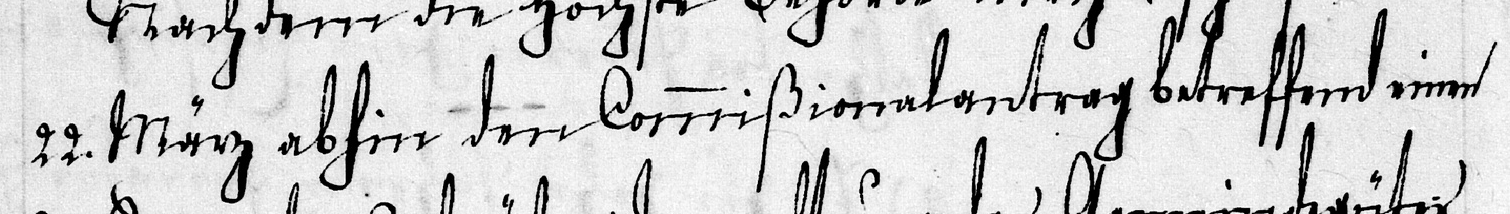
22. März abhin den Commißionalantrag betreffend einen
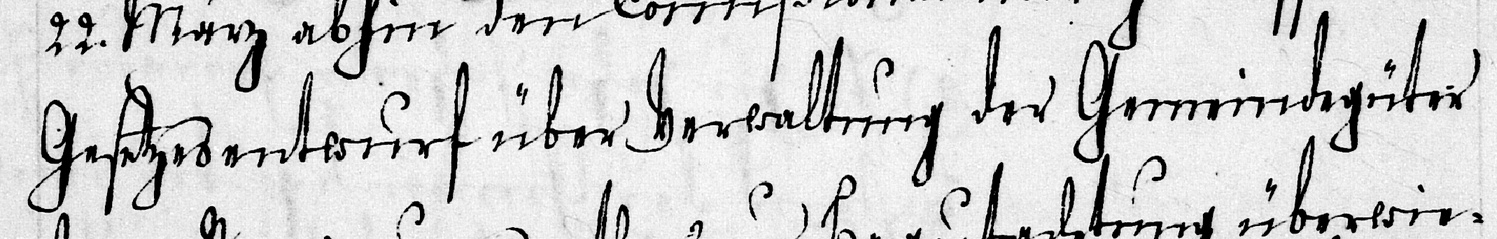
Gesetzesentwurf über Verwaltung der Gemeindegüter
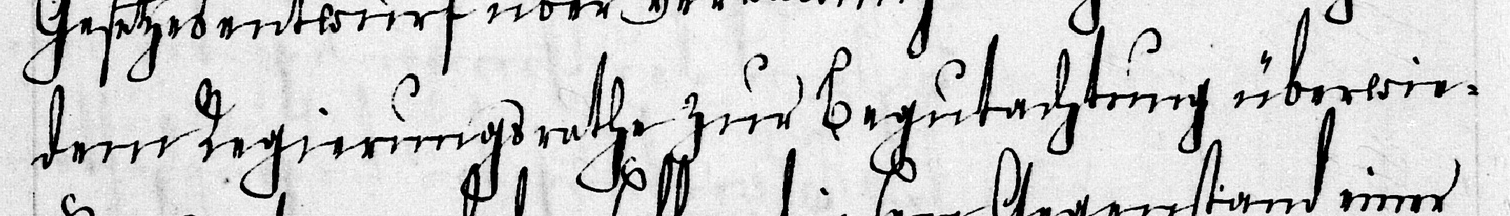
dem Regierungsrathe zur Begutachtung überwie¬
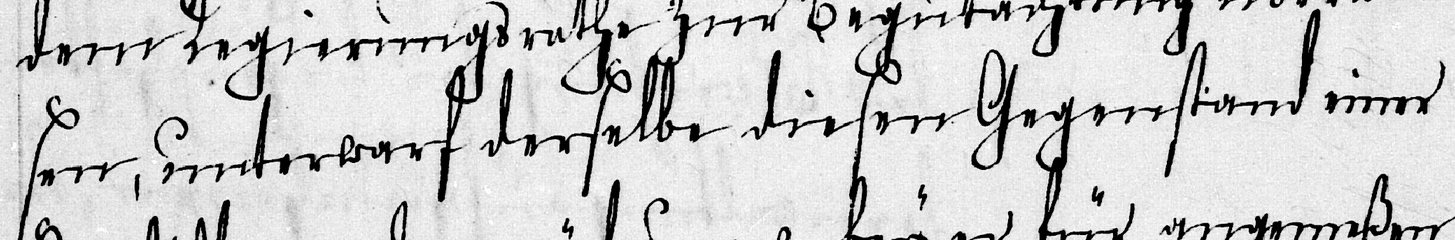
sen, unterwarf derselbe diesen Gegenstand einer
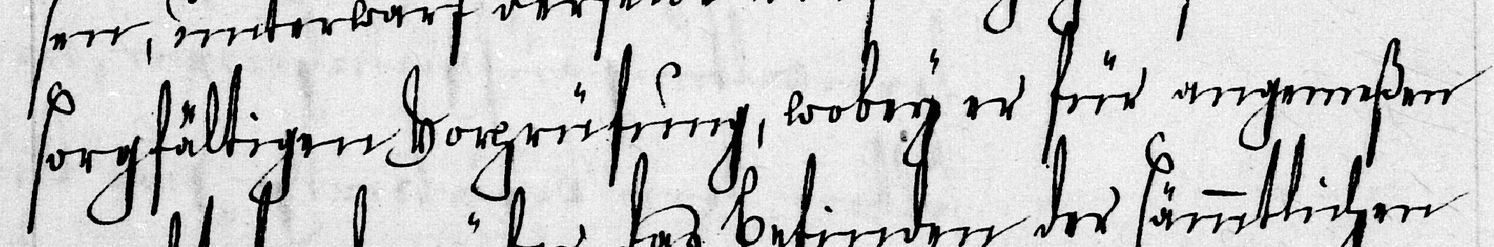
sorgfältigen Vorprüfung, wobey er für angemeßen
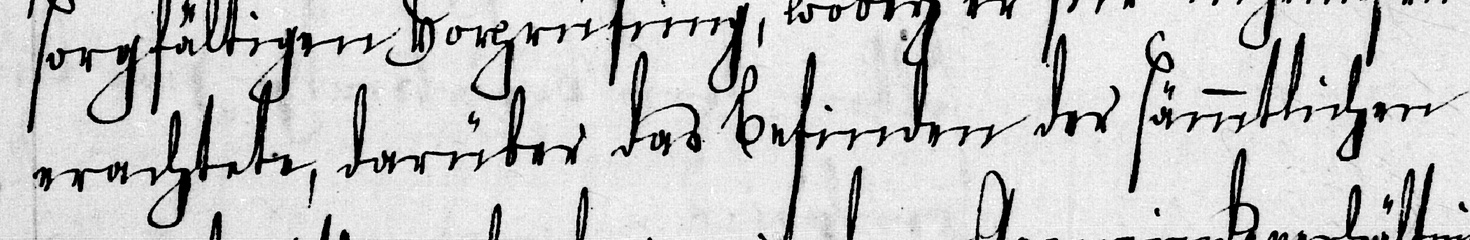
erachtete, darüber das Befinden der sämmtlichen
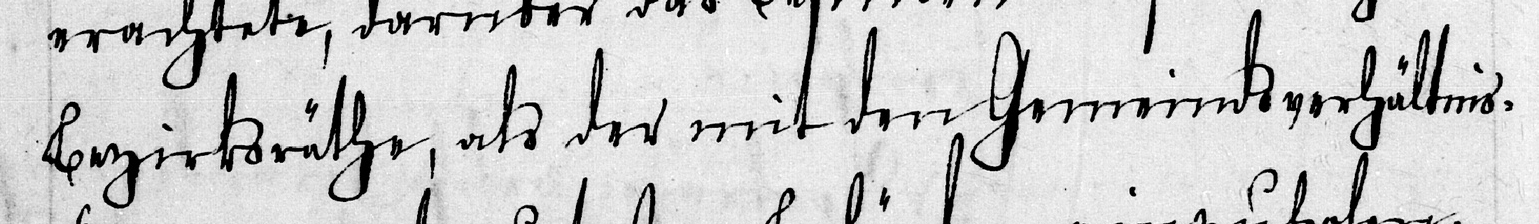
Bezirksräthe, als der mit den Gemeindsverhältni¬
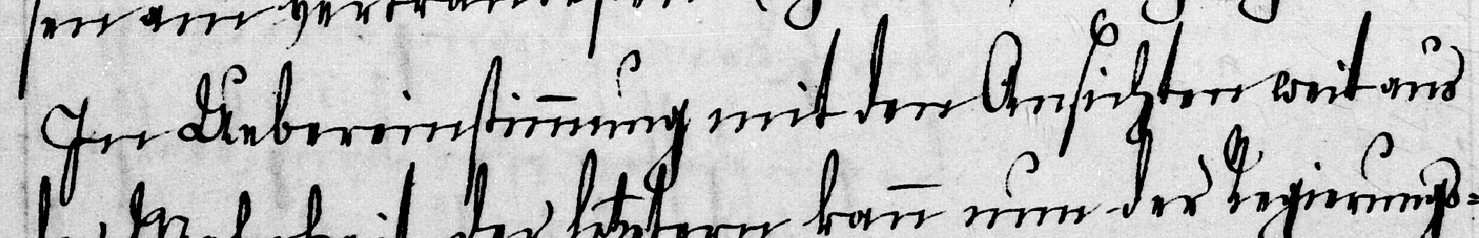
In Uebereinstimmung mit den Ansichten weit aus
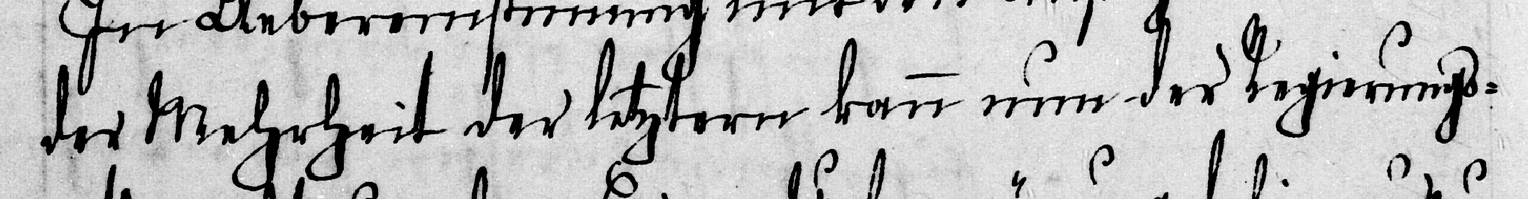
der Mehrheit der letztern kann nun der Regierungs¬
